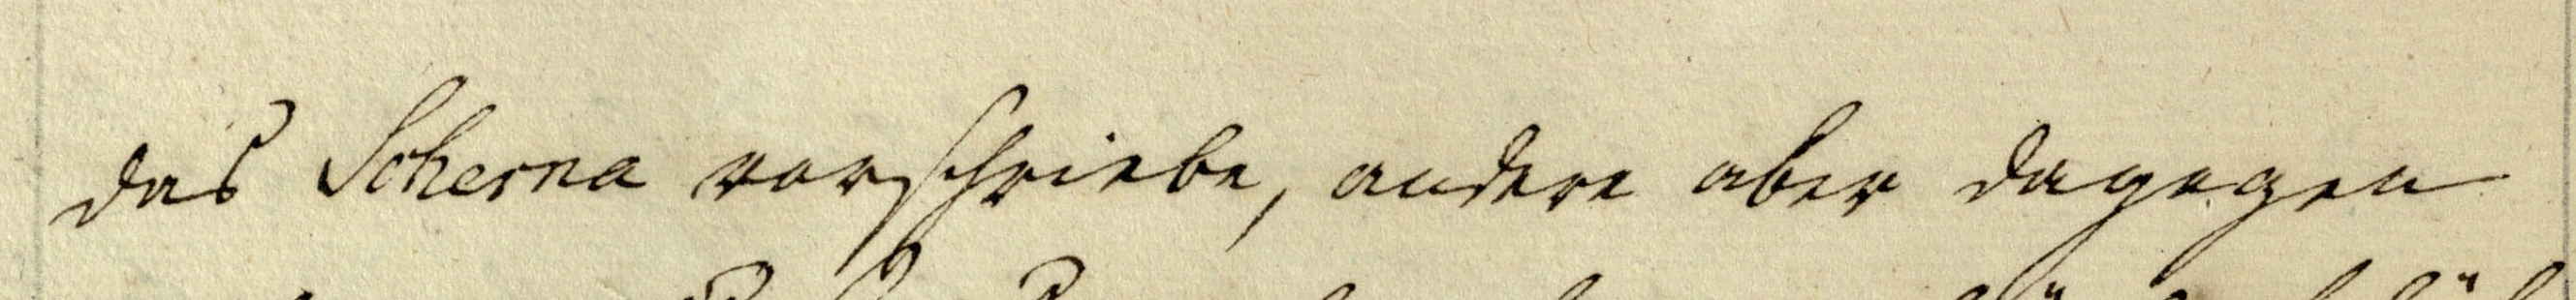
das Schema vorschriebe, andere aber dagegen
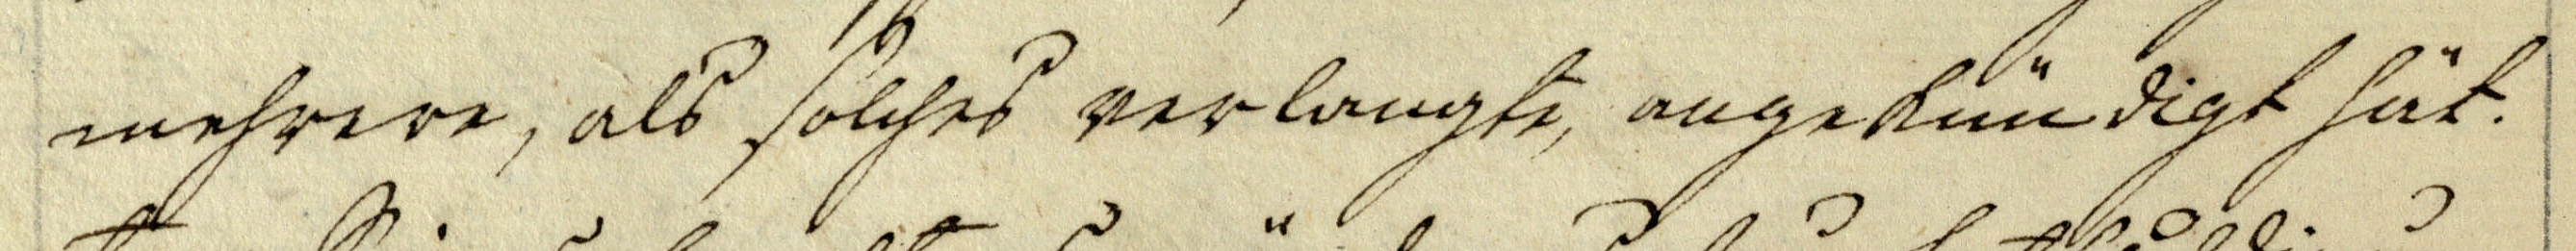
mehrere, als solches verlangte, angekündigt hät¬
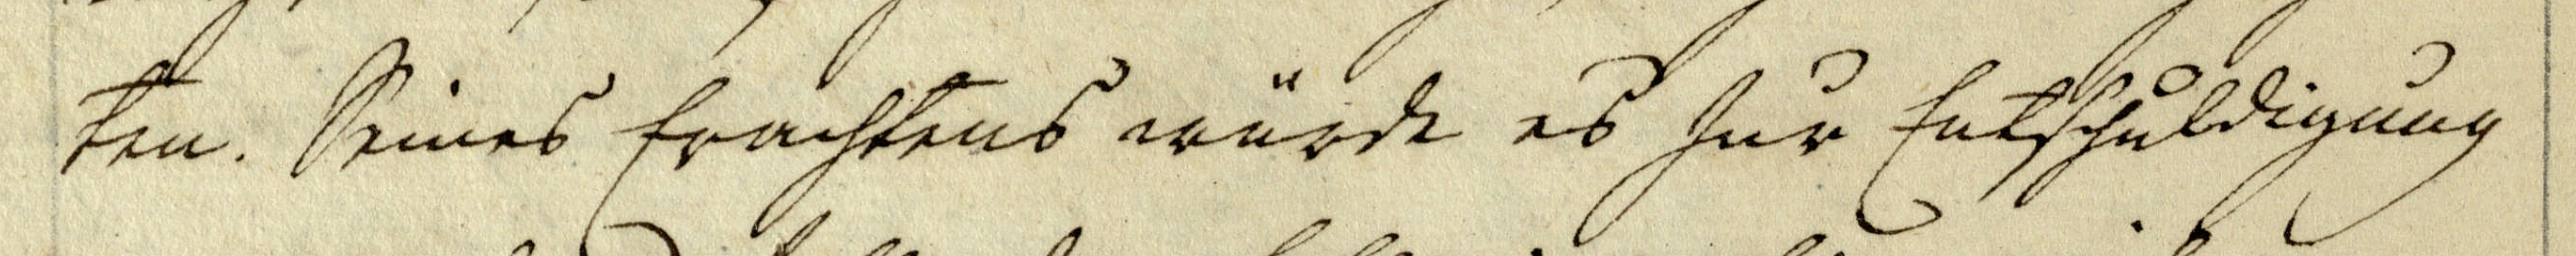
ten. Seines Erachtens würde es zur Entschuldigung
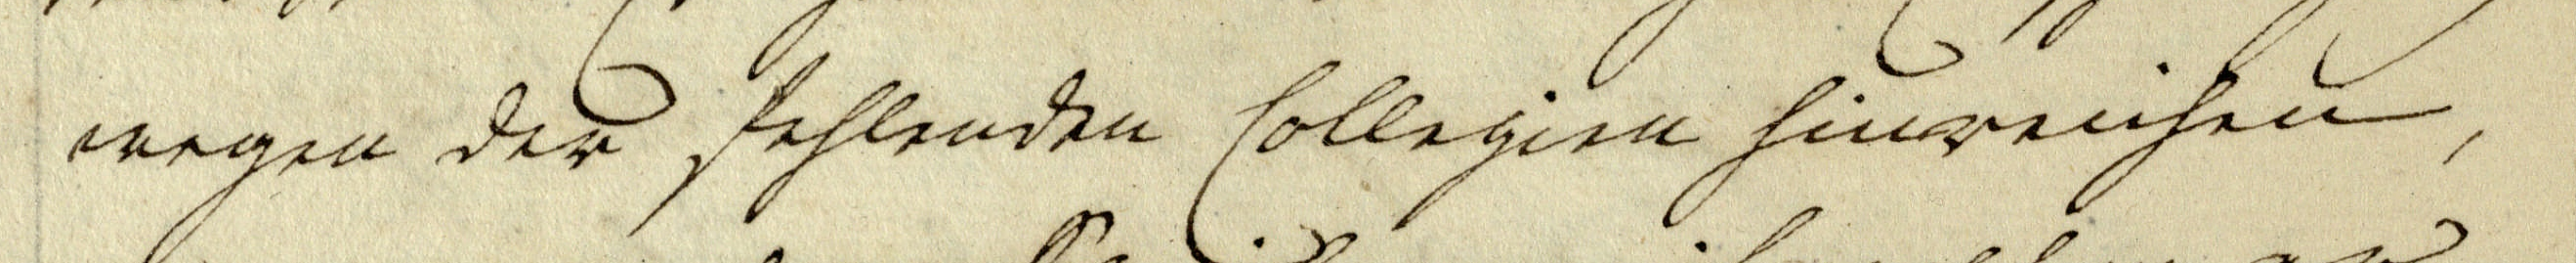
wegen der fehlenden Collegien hinreichen,
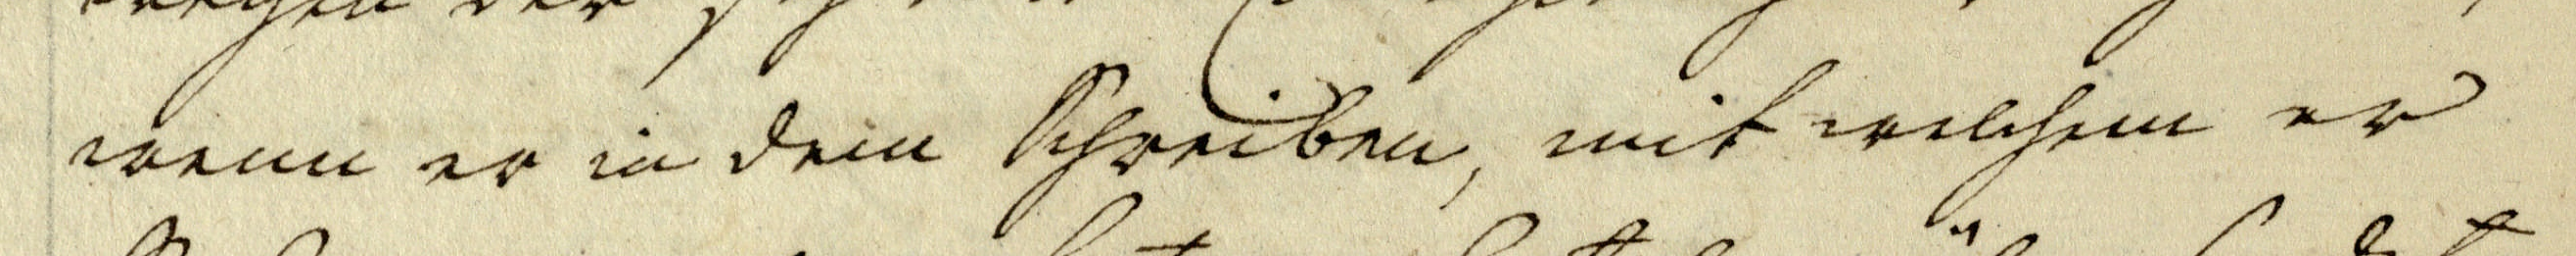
wenn er in dem Schreiben, mit welchem er
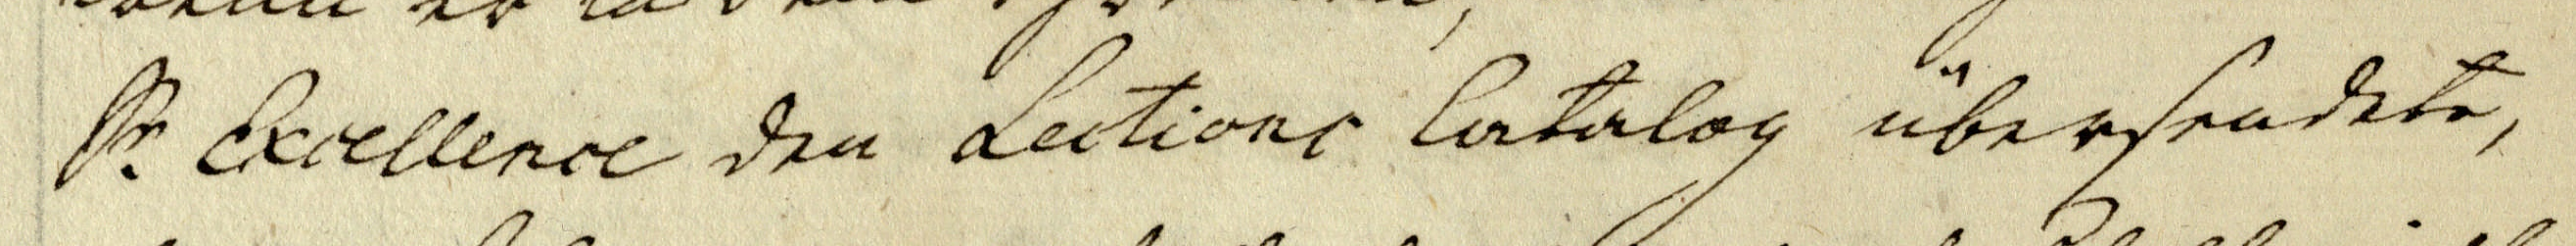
Sr Excellence den Lections Catalog übersendete,
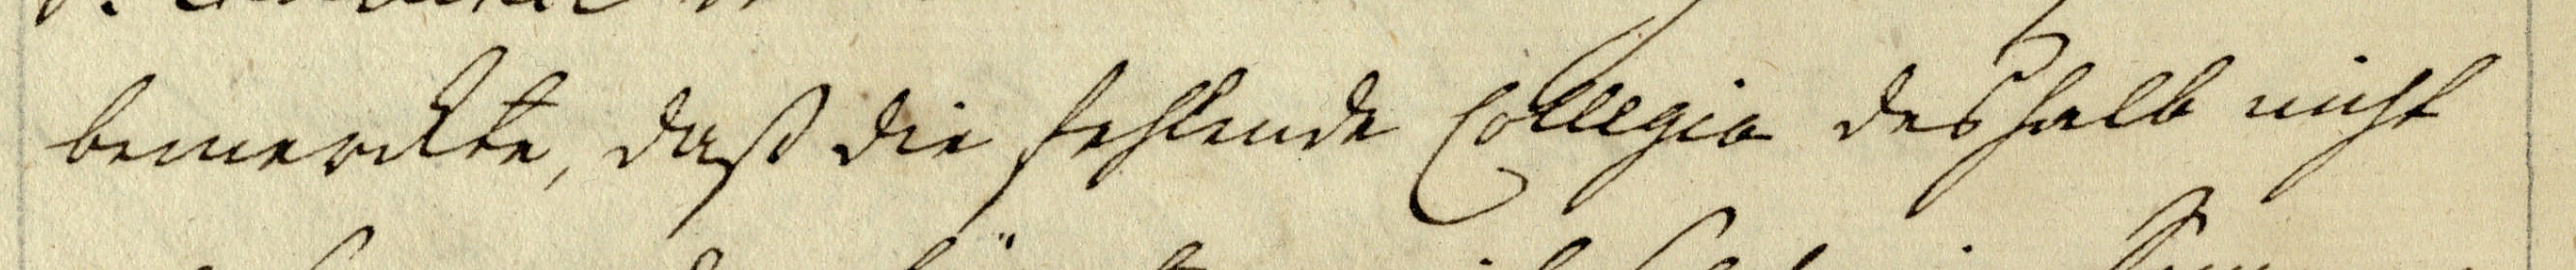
bemerckte, daß die fehlenden Collegia deshalb nicht
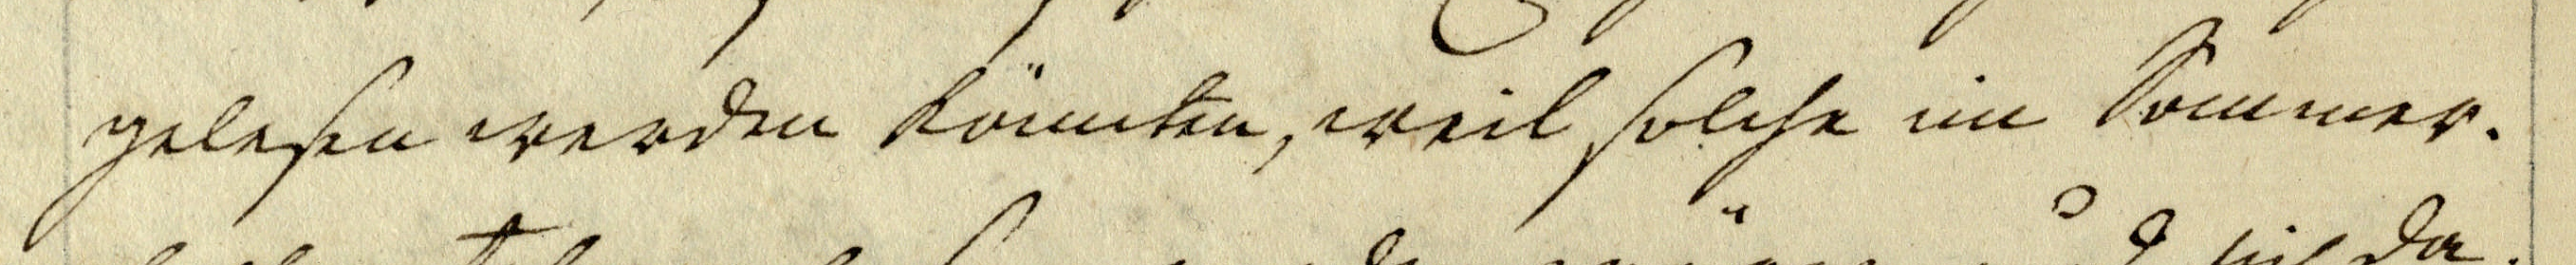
gelesen werden könnten, weil solche im Sommer¬
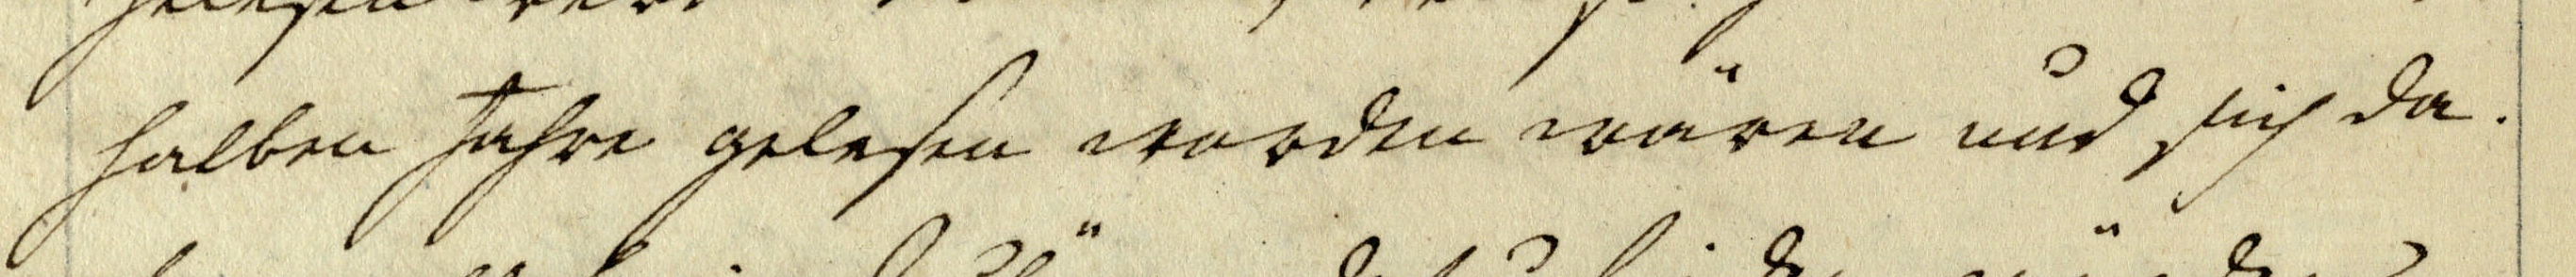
halben Jahre gelesen worden wären und sich da¬
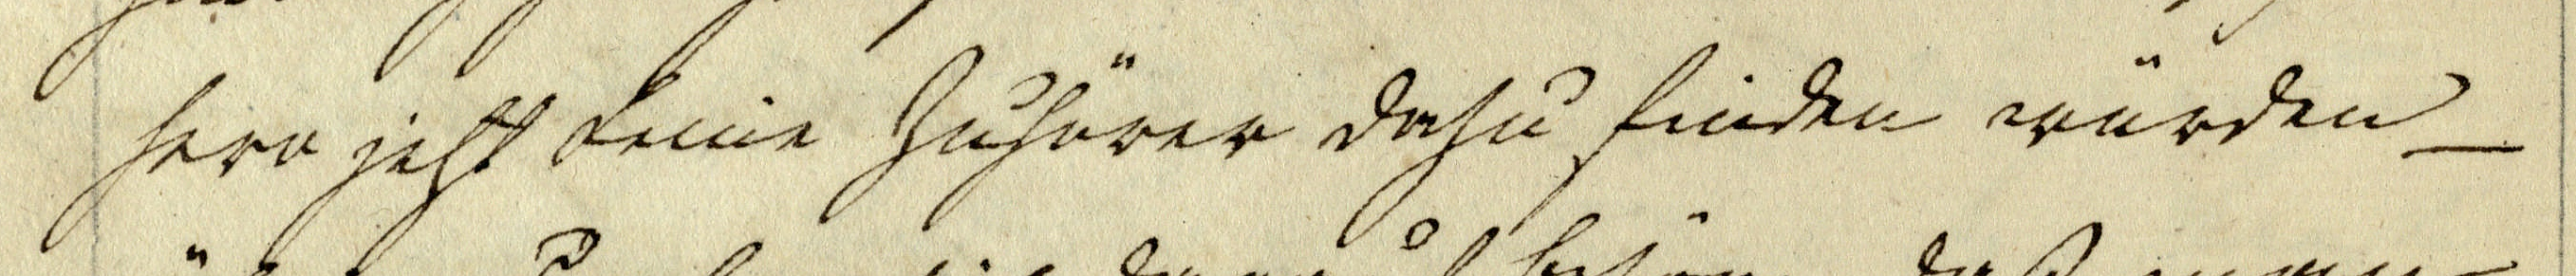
hero jetzt keine Zuhörer dazu finden würden -
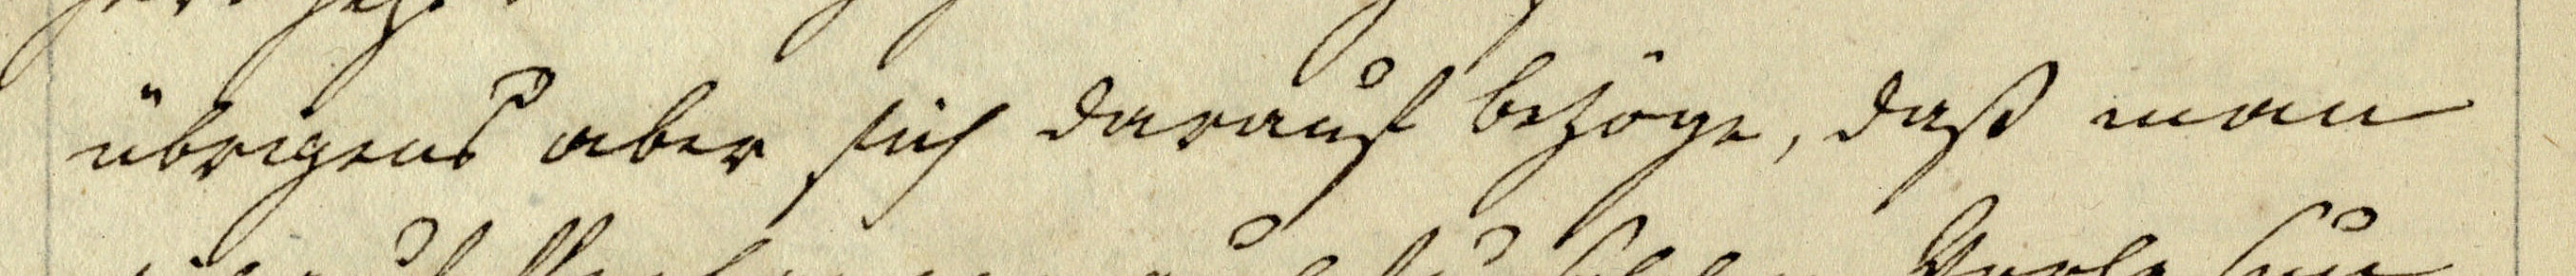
übrigens aber sich darauf bezöge, daß man
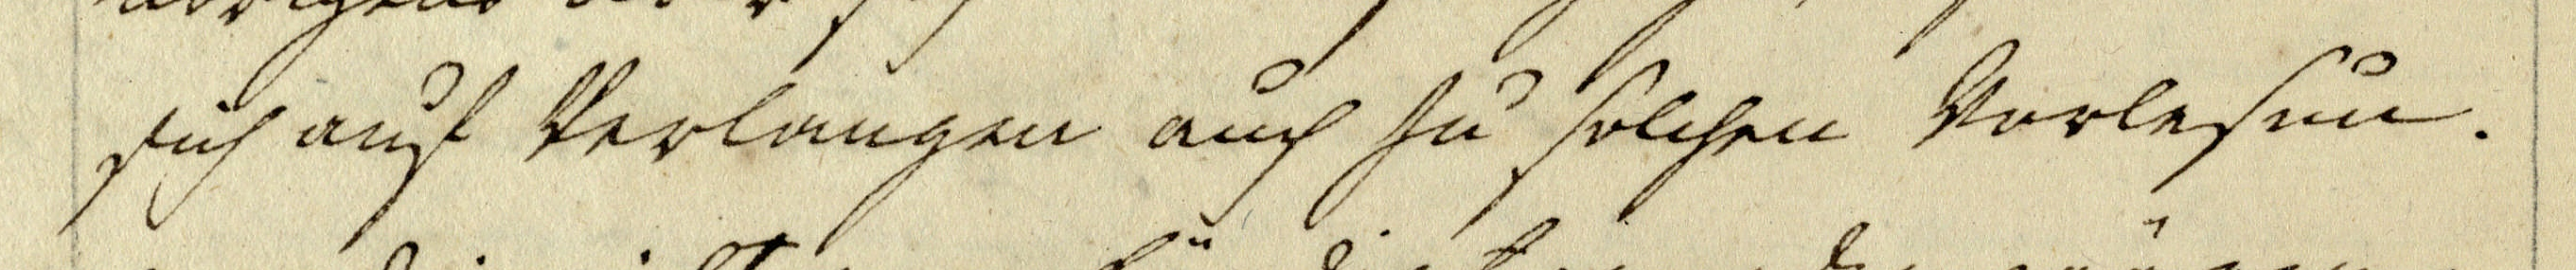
sich auf Verlangen auch zu solchen Vorlesun¬
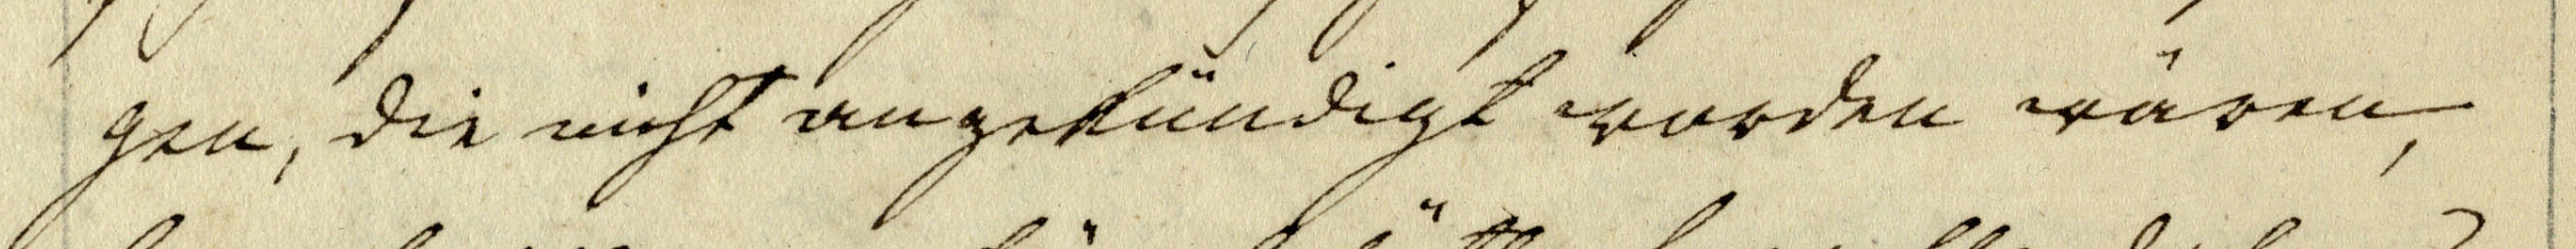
gen, die nicht angekündigt worden wären,
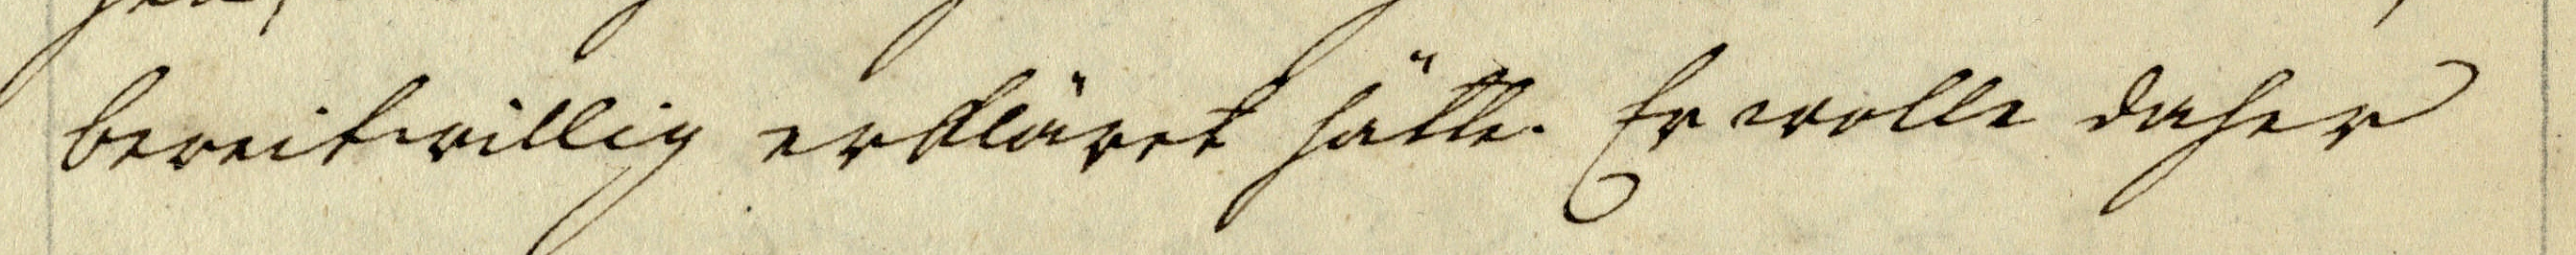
bereitwillig erkläret hätte. Er wolle daher
